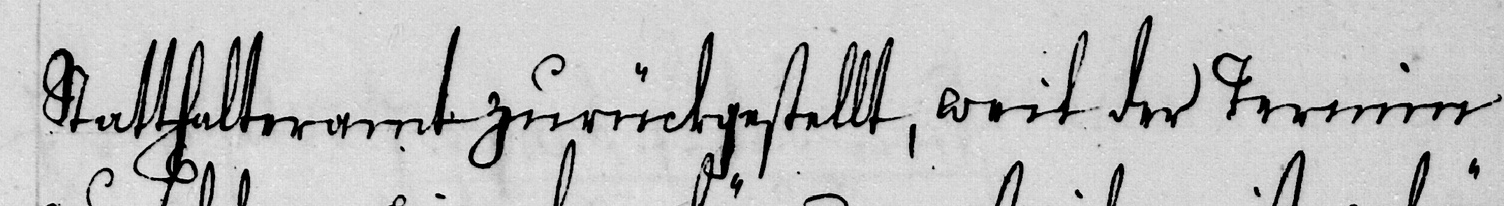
Statthalteramt zurückgestellt, weil der Termin
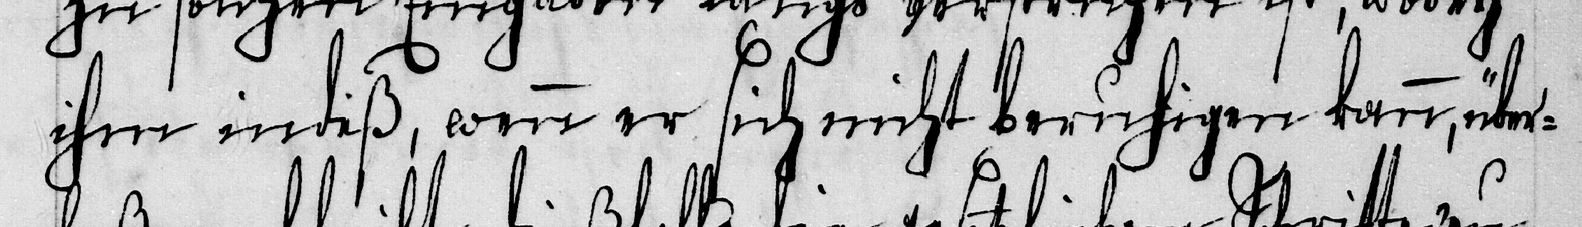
ihm indeß, wenn er sich nicht beruhigen kann, übe¬
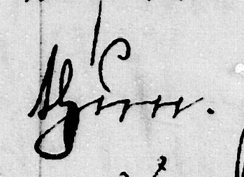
thun.
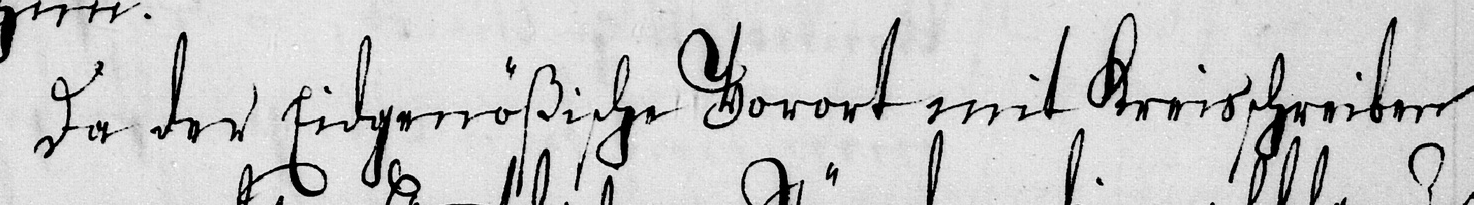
Da der Eidgenößische Vorort mit Kreisschreiben
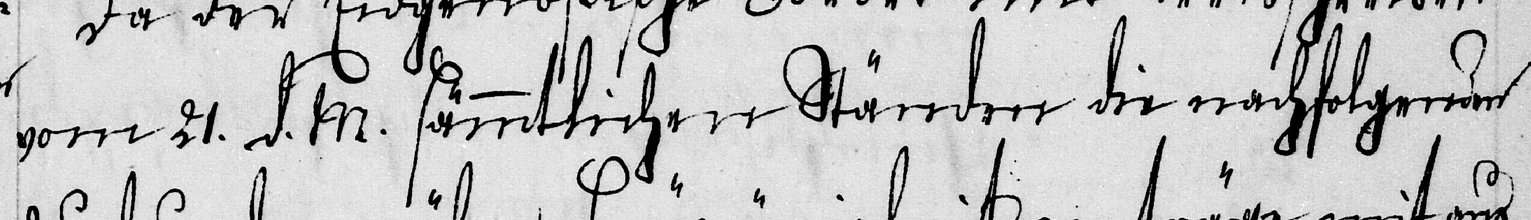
vom 21. d. M. sämmtlichen Ständen die nachfolgenden
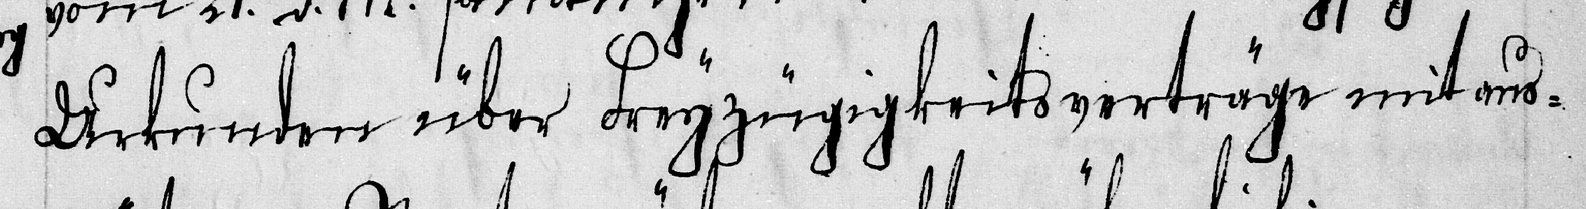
Urkunden über Freyzügigkeitsverträge mit aus¬
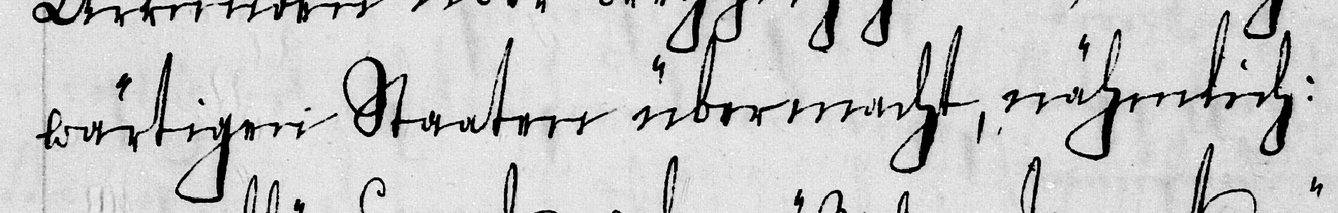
wärtigen Staaten übermacht, nähmlich:
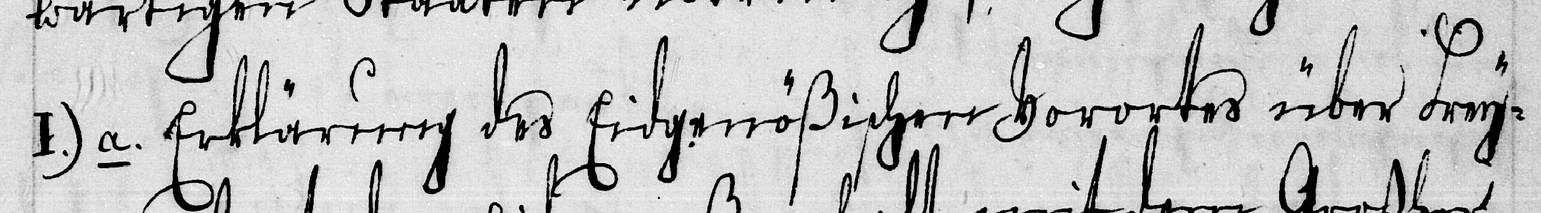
I.) a. Erklärung des Eidgenößischen Vorortes über Frey¬
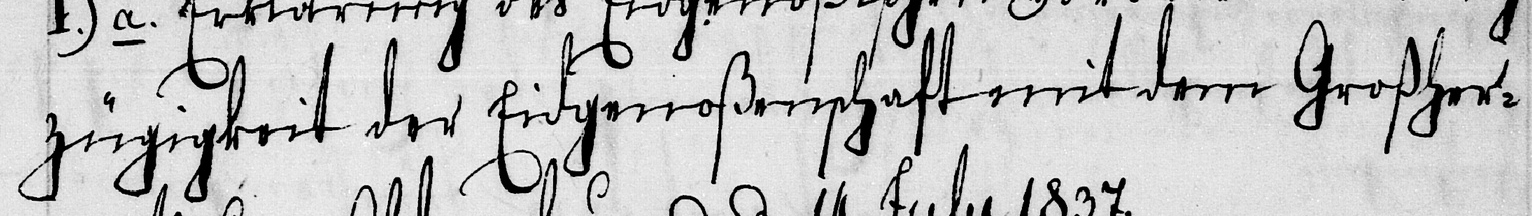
zügigkeit der Eidgenoßenschaft mit dem Großher¬
